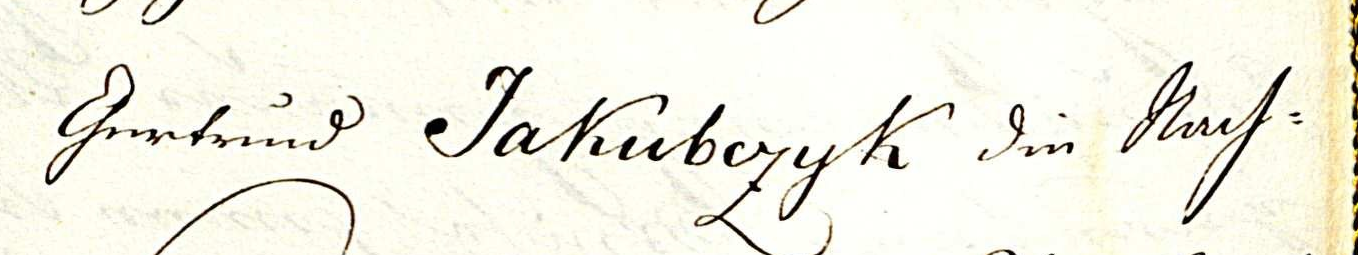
Gertrud Jakubczyk die Nach¬
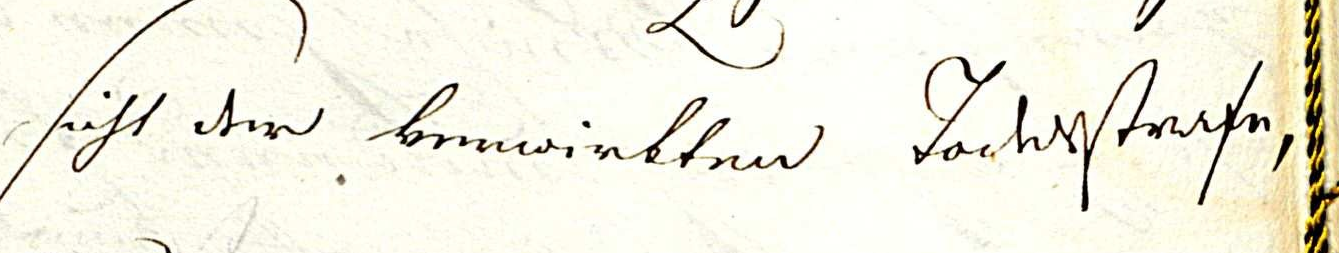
sicht der bewirkten Todestrafe
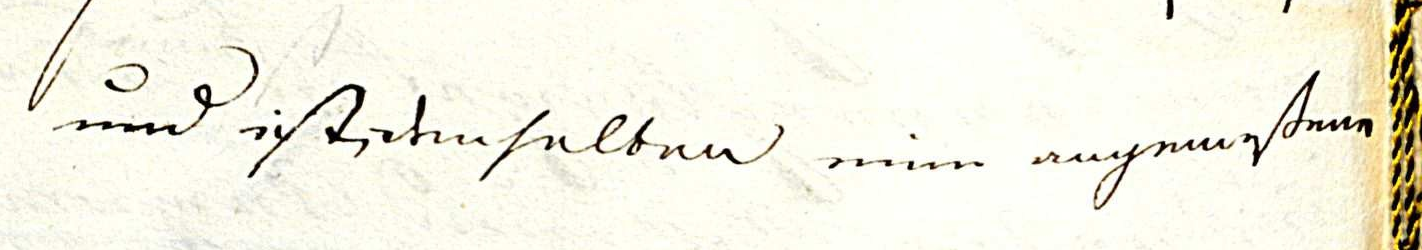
und ist demselben eine angemeßene
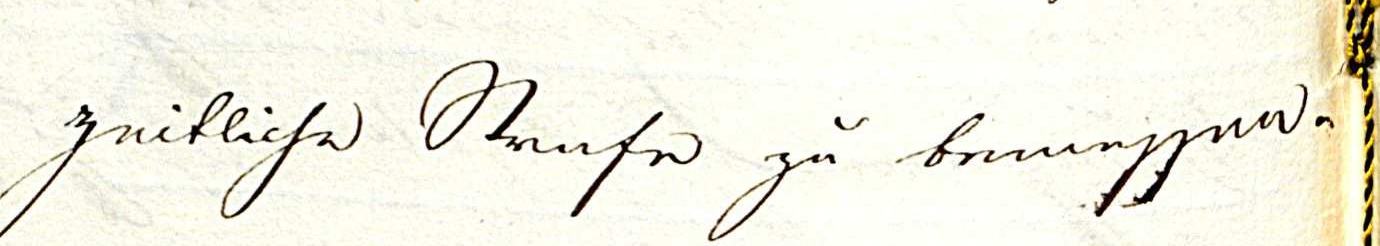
zeitliche Strafe zu bemessen.
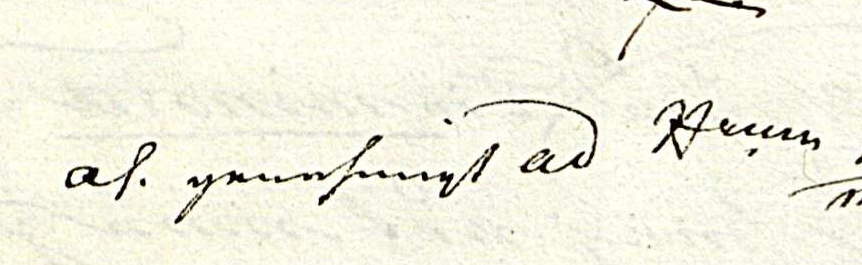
Ah genehmigt ad Henne
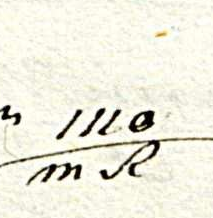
1110
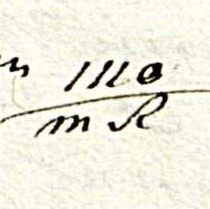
mR
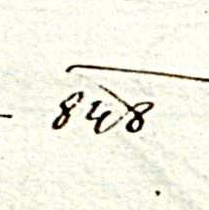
848
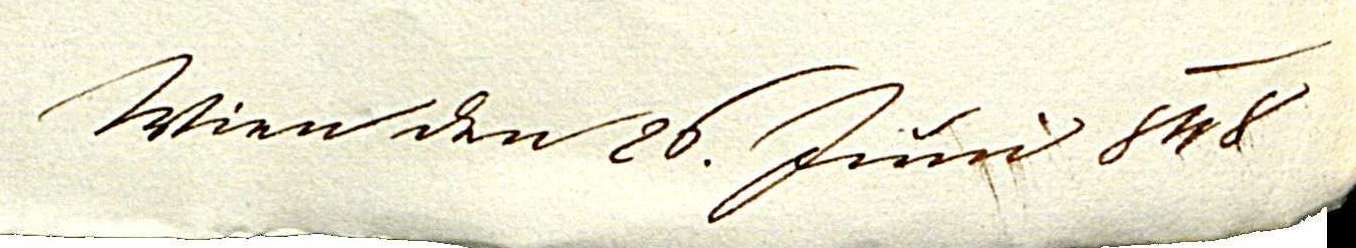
Wien den 26 Juni [1]848
